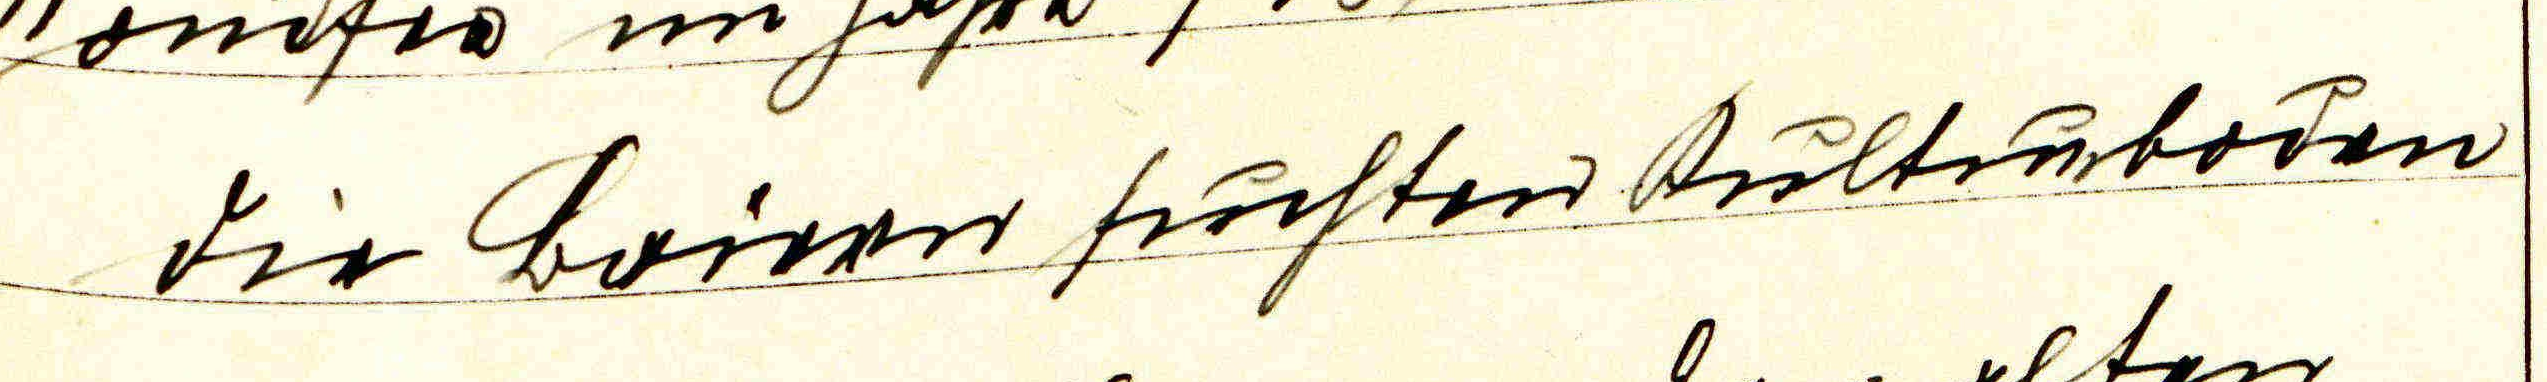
Die Baiern suchten Kulturboden
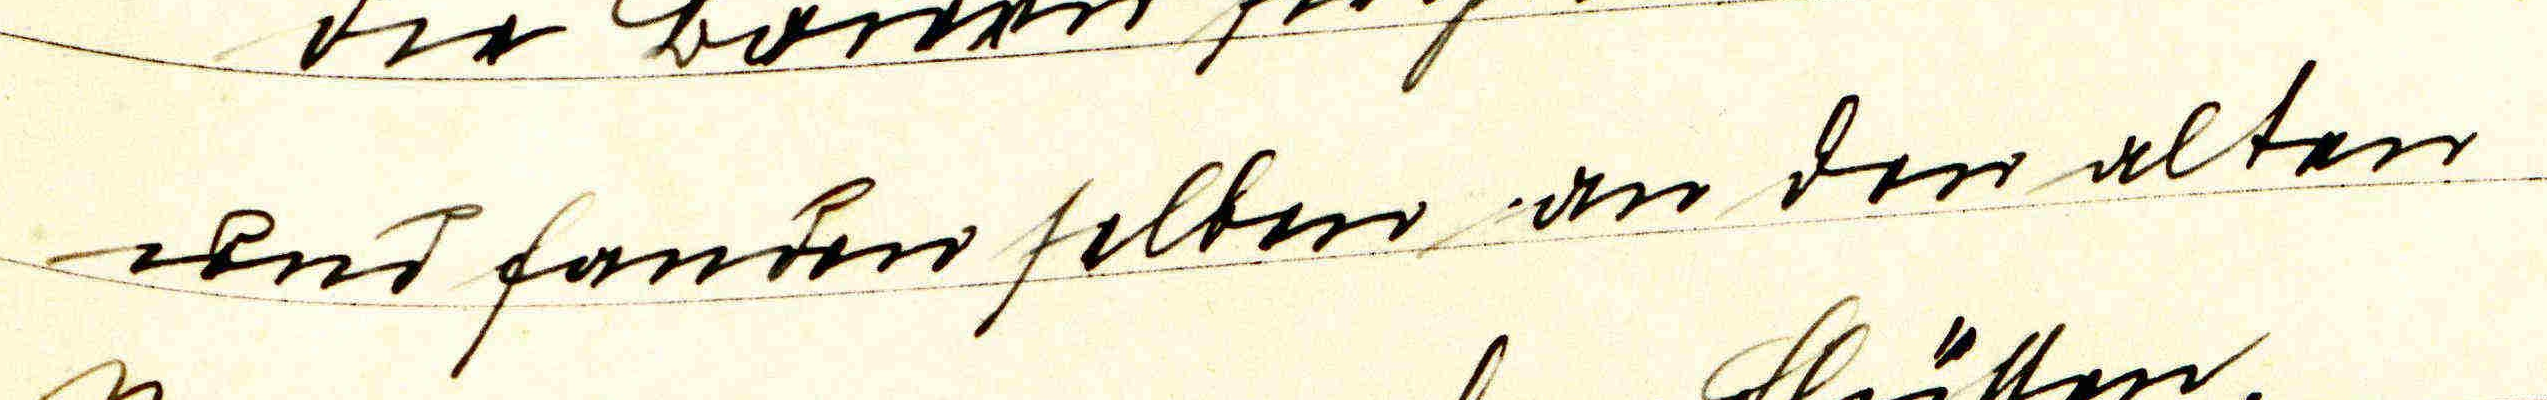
und fanden selben an den alten
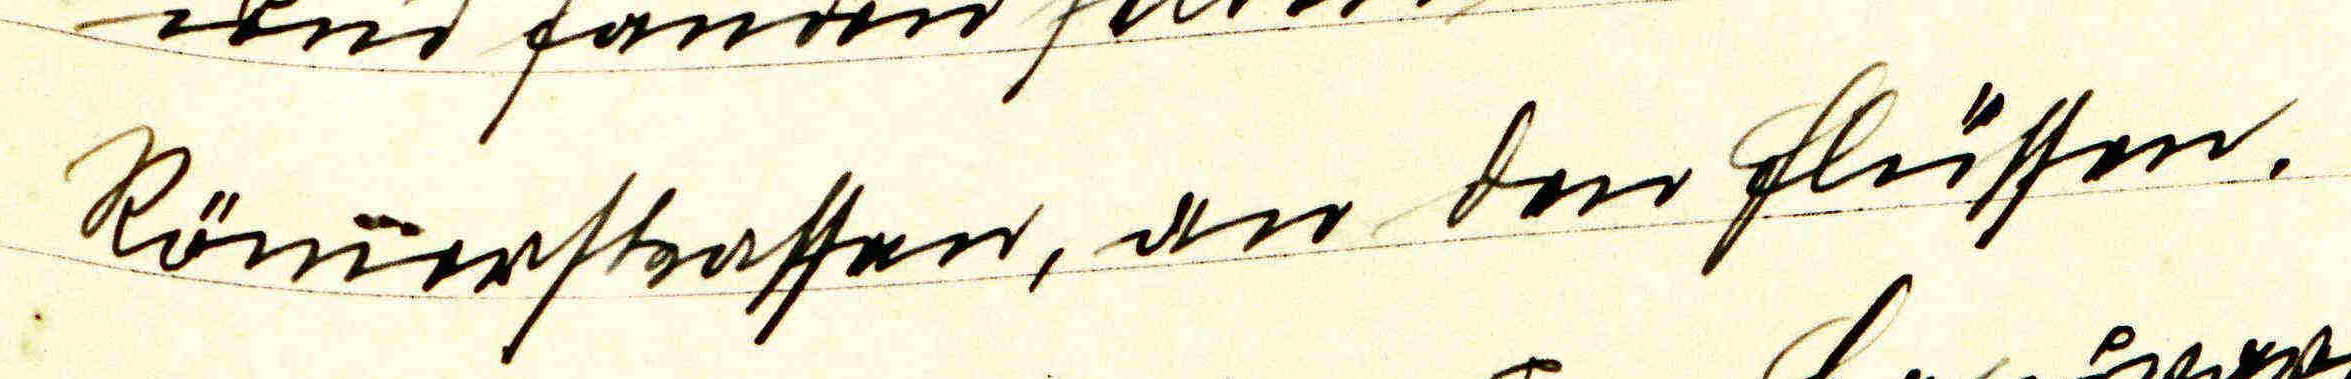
Römerstrassen, an den Flüssen.
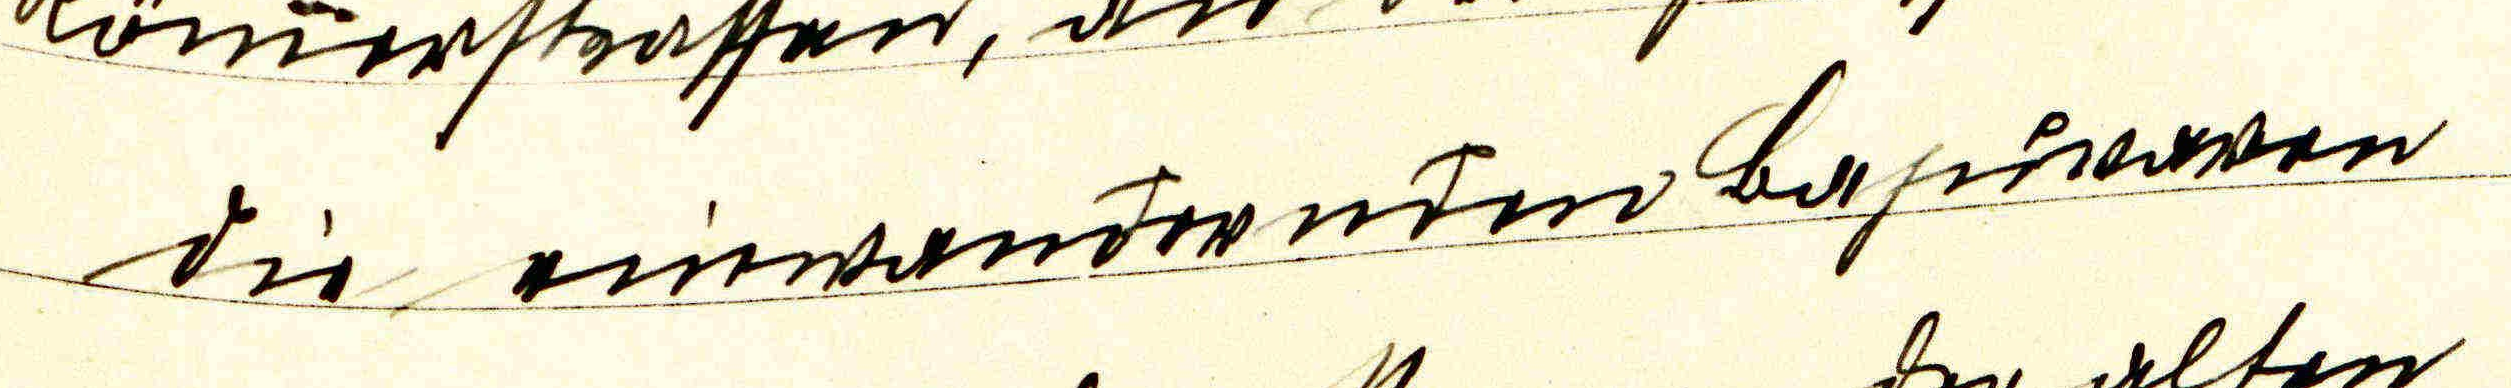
Die einwandernden Bajuwaren
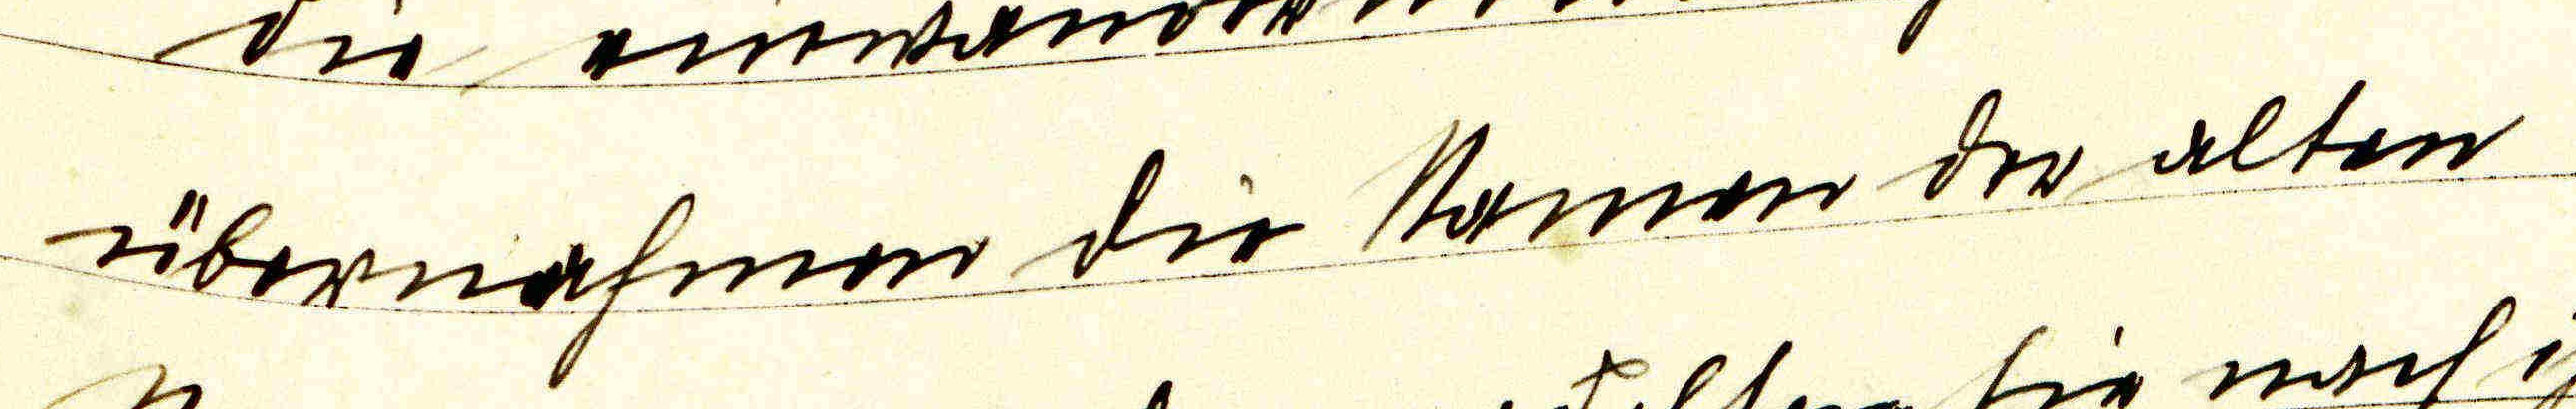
übernahmen die Namen der alten
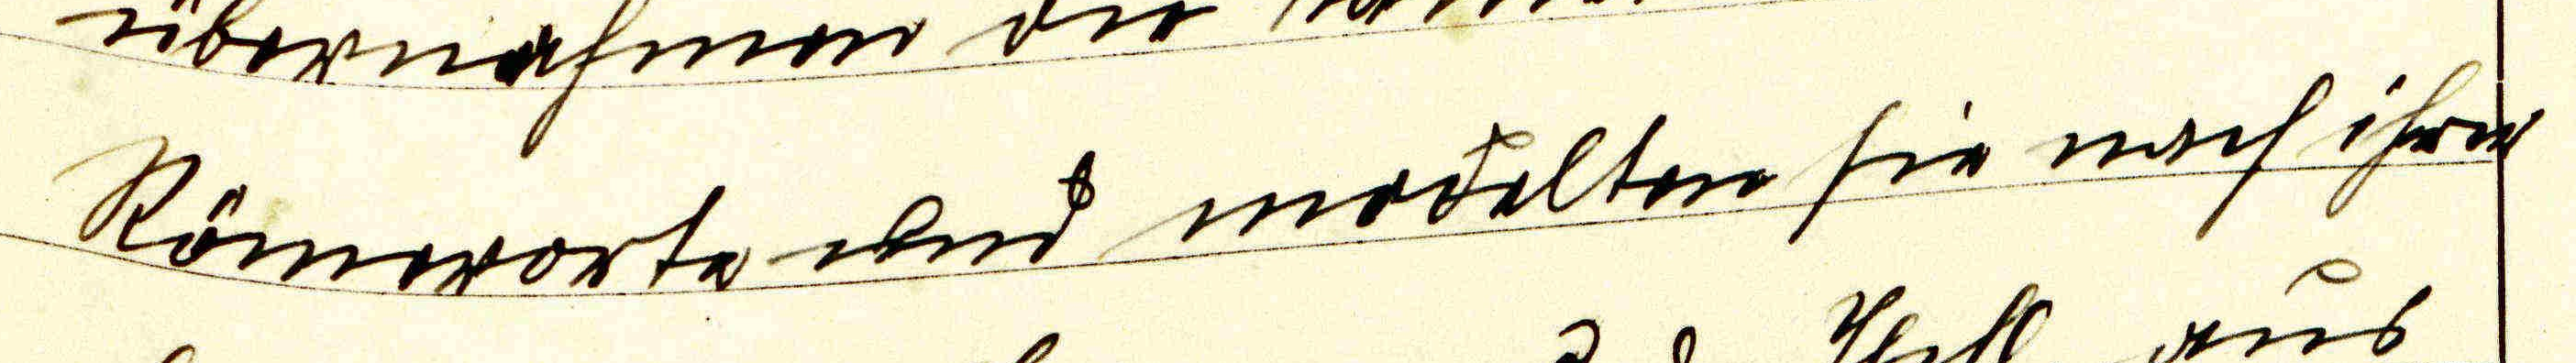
Römerorte und modelten sie nach ihrer
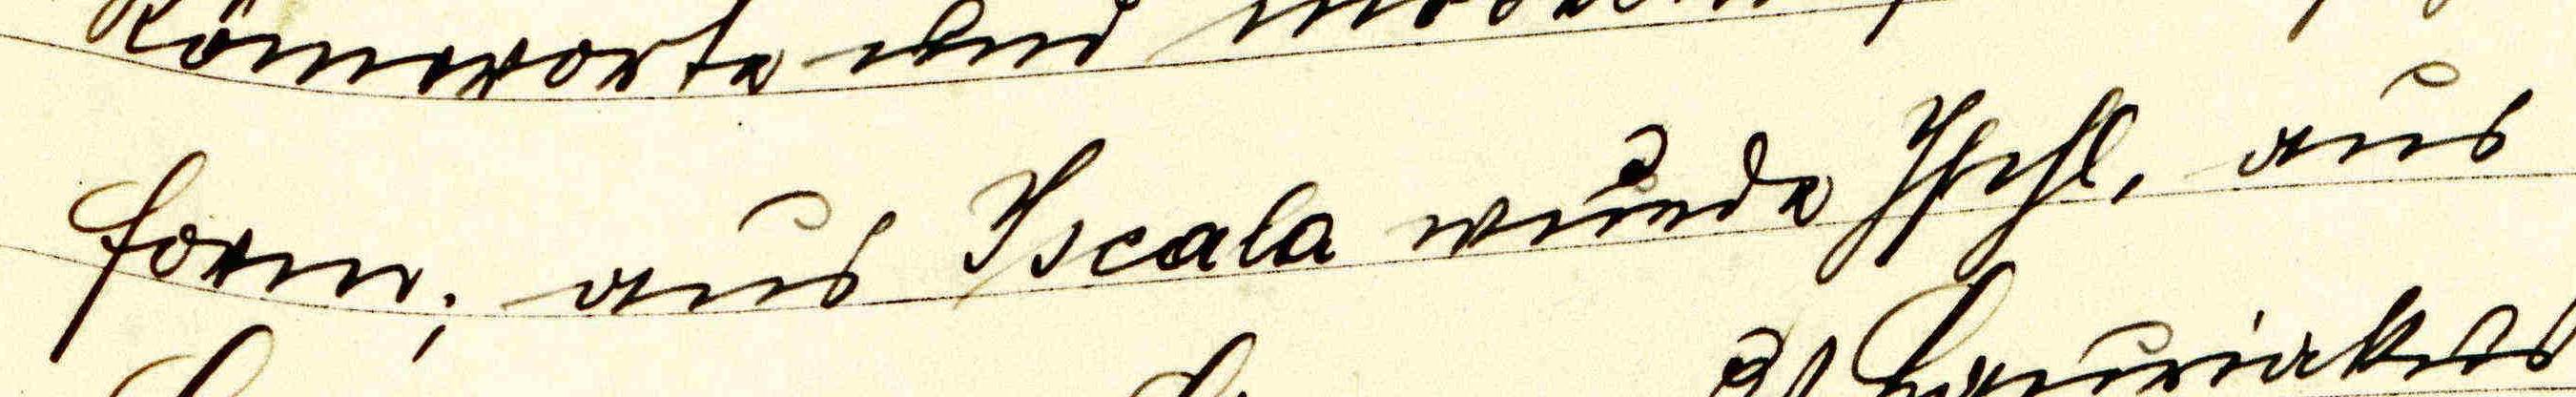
Form; aus Iscala wurde Ischl, aus
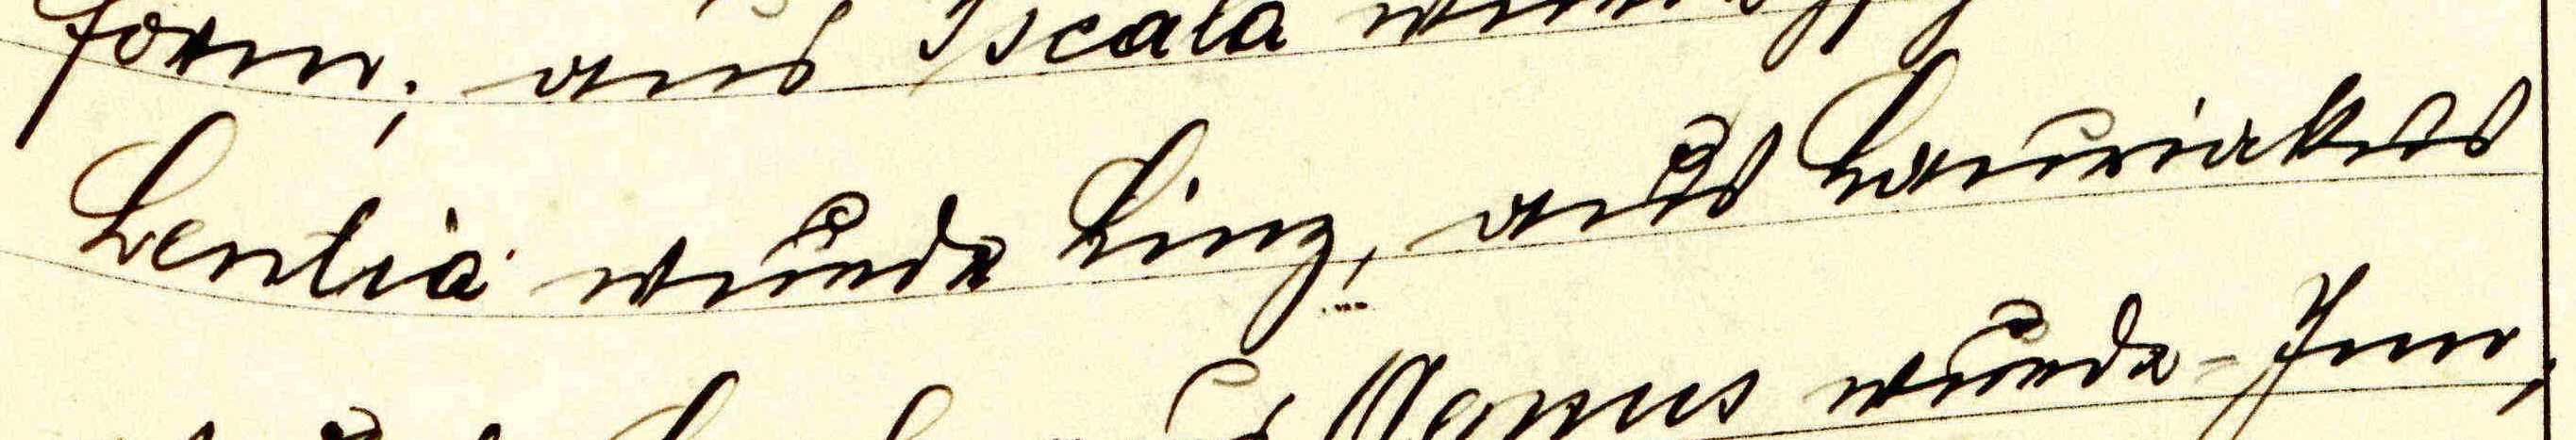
Lentia wurde Linz, aus Lauriakus
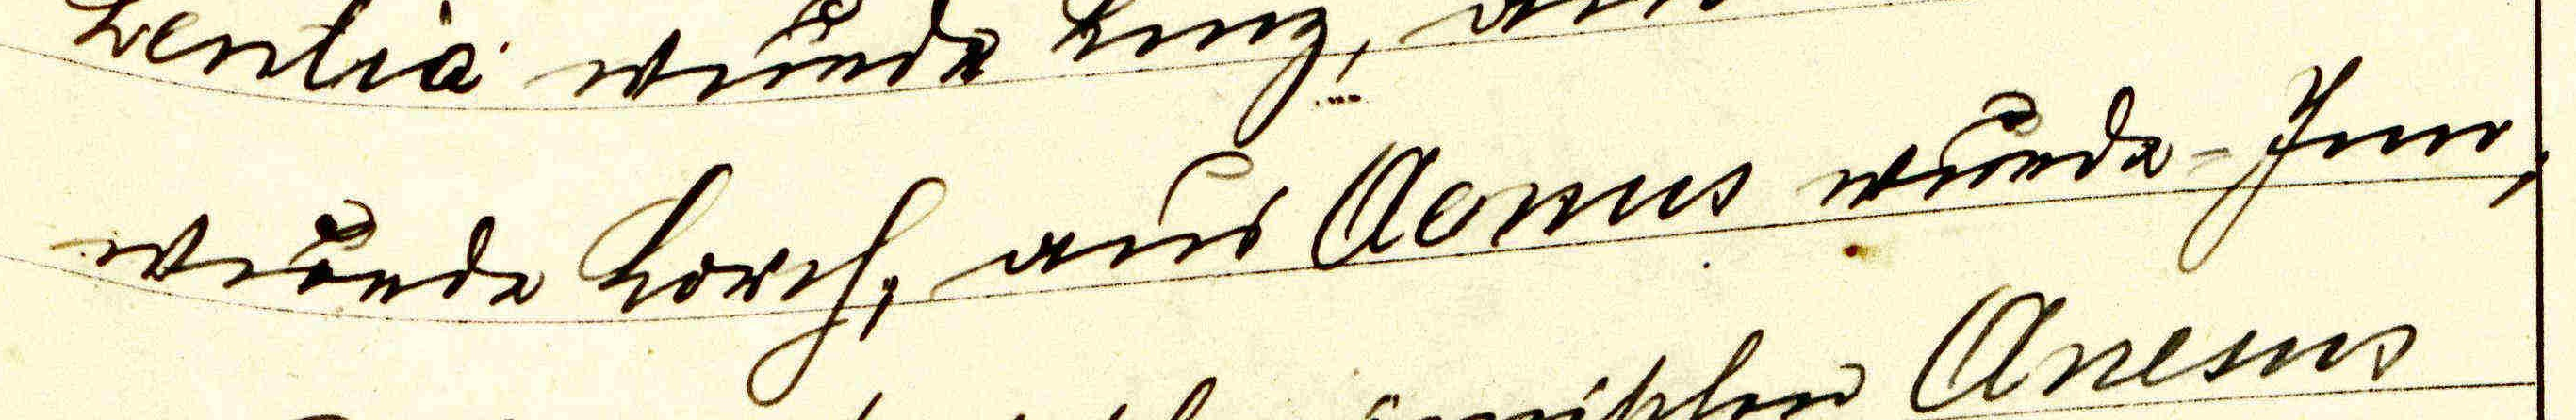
wurde Lorch, aus Aenus wurde Inn,
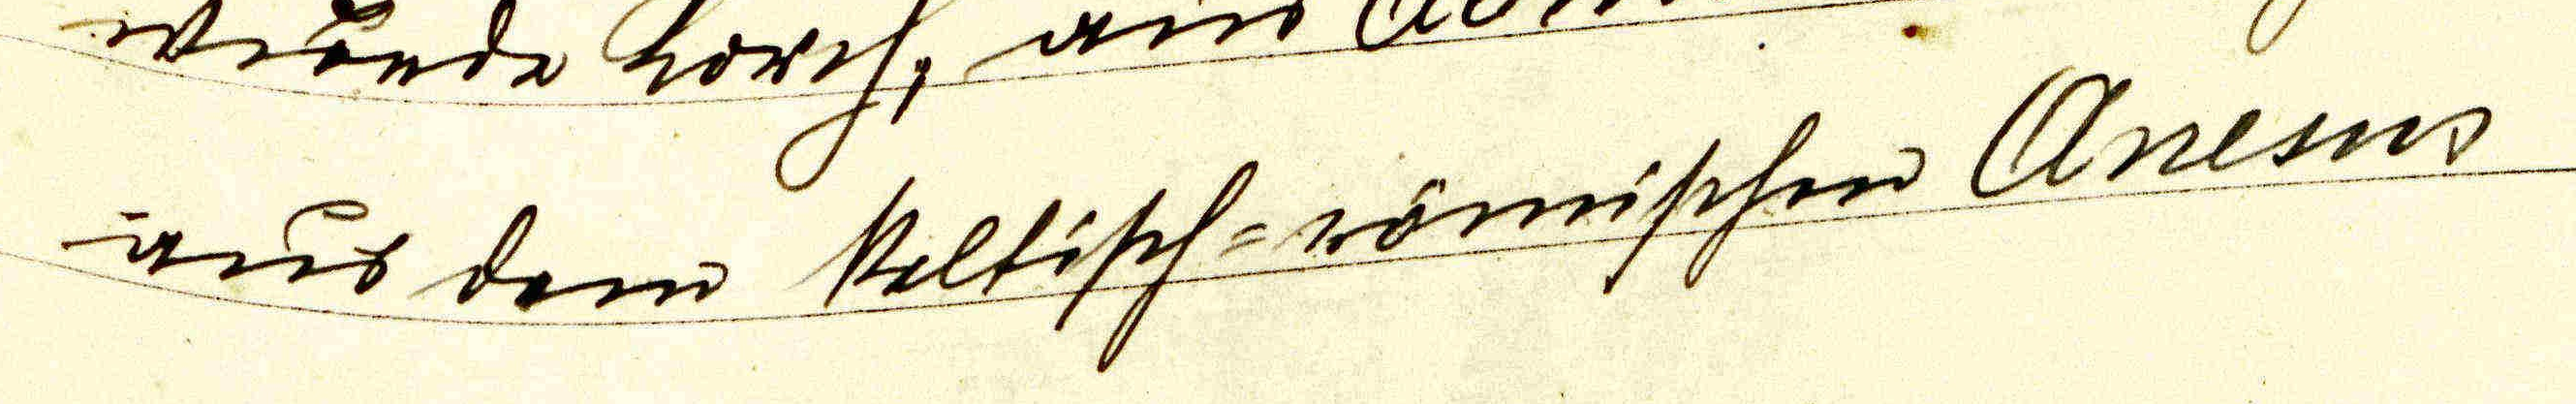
aus dem keltisch-römischen Anesus
